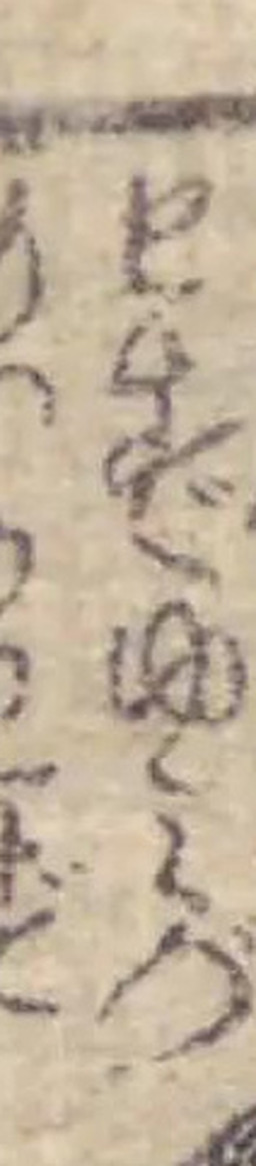もつかわず
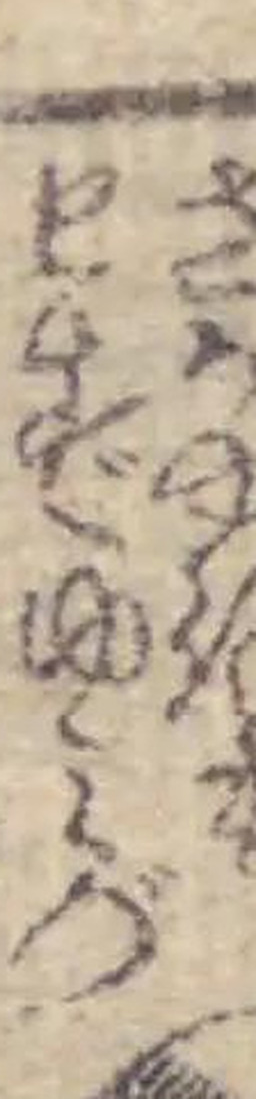せずゆみず
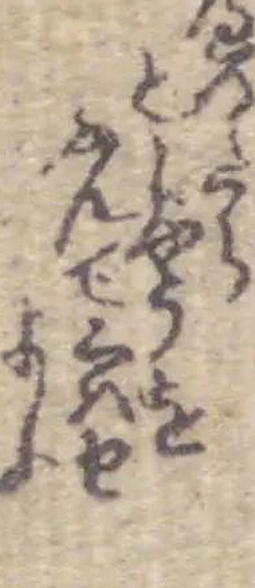ふんでくはせ
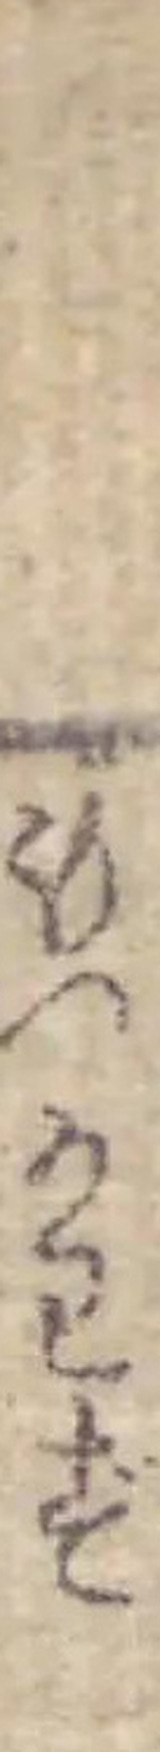もつかわず
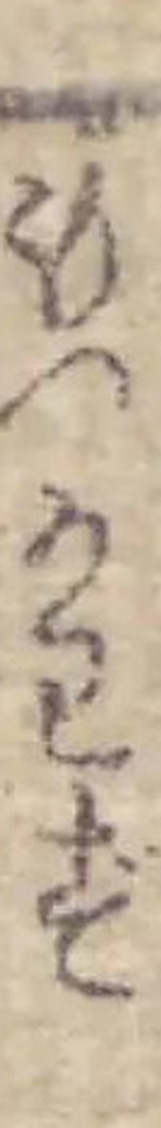もつかわず
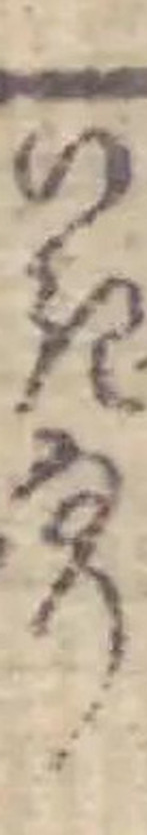いきなり
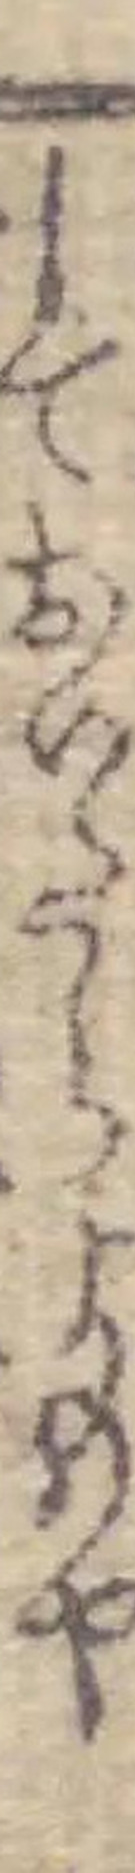しておいたらよもや
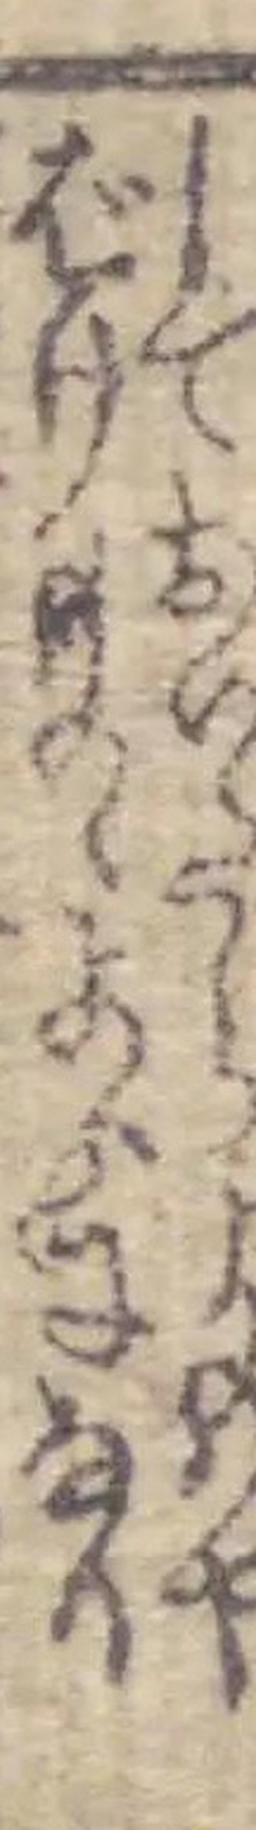ばけものゝよふになり
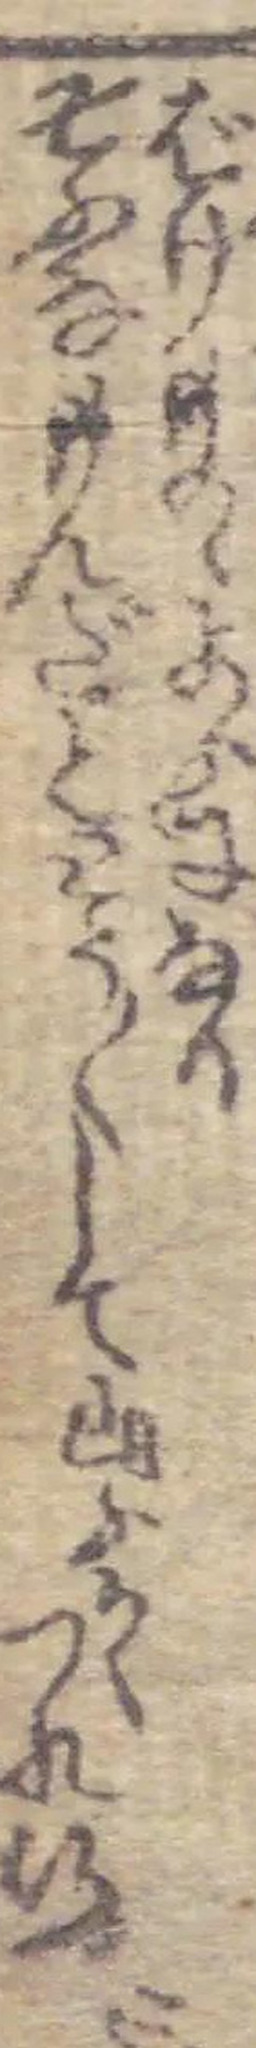そふなもんだととう〳〵して山ふかく

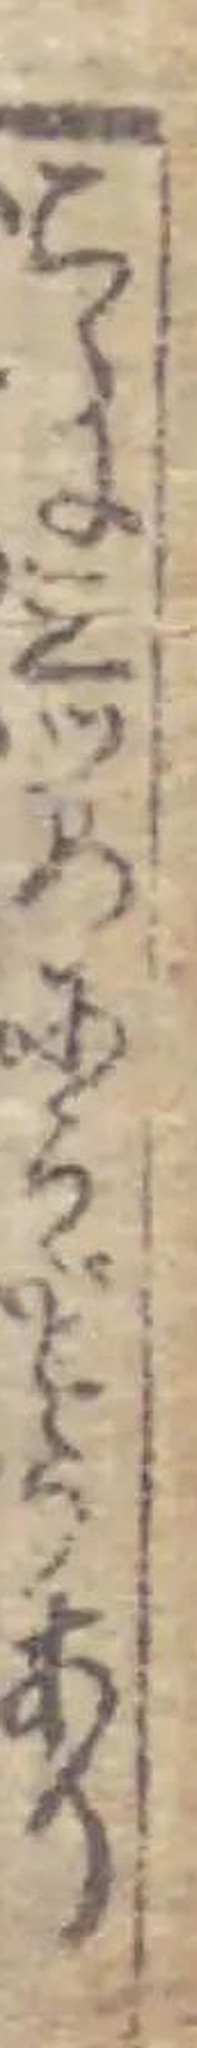こゝに三ッめにうどうあり
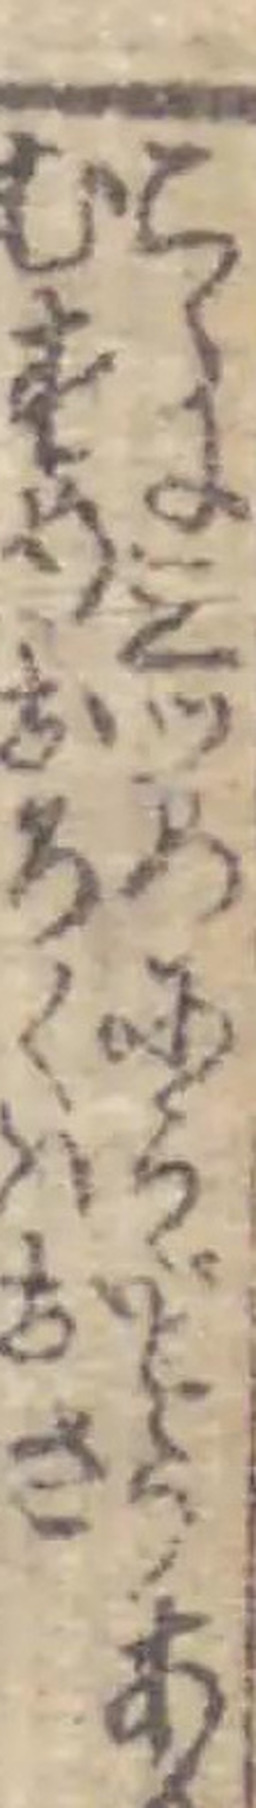むすめおろくはおさ
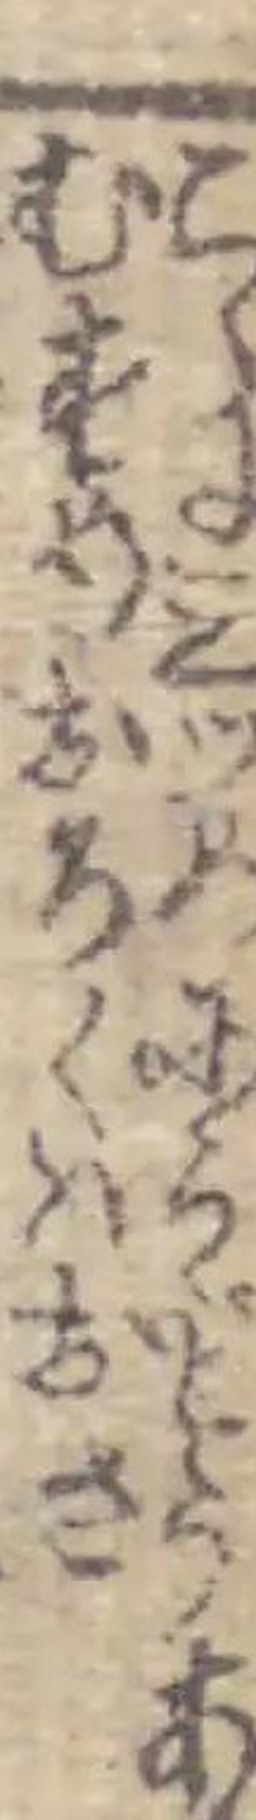むすめおろくはおさ
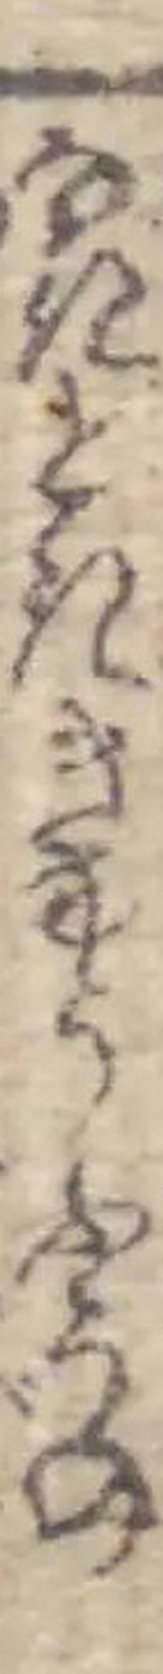なきとききやうふうの
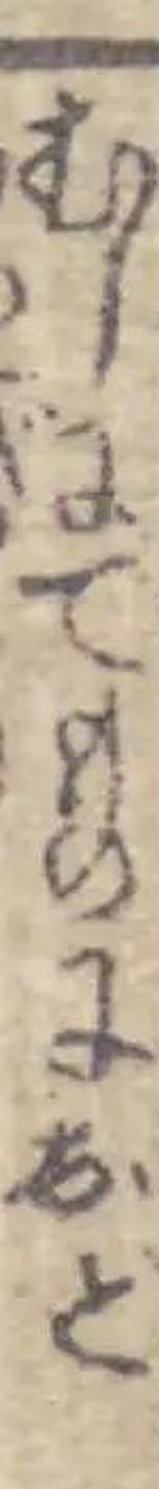むしにてものにおど
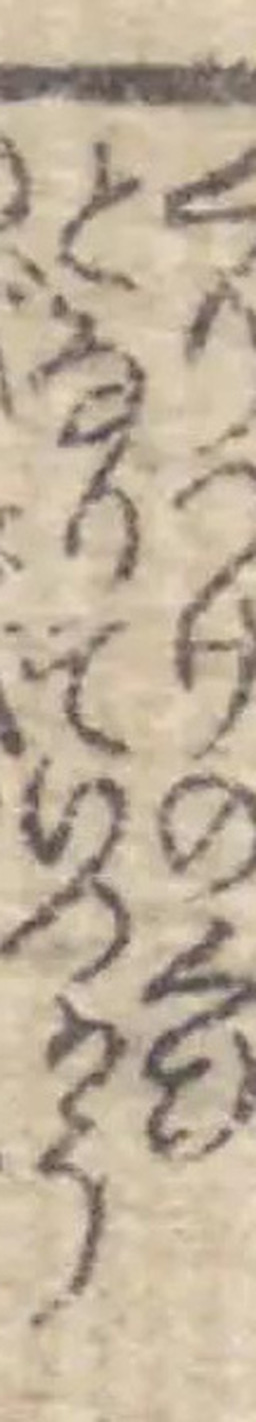となりていつかう
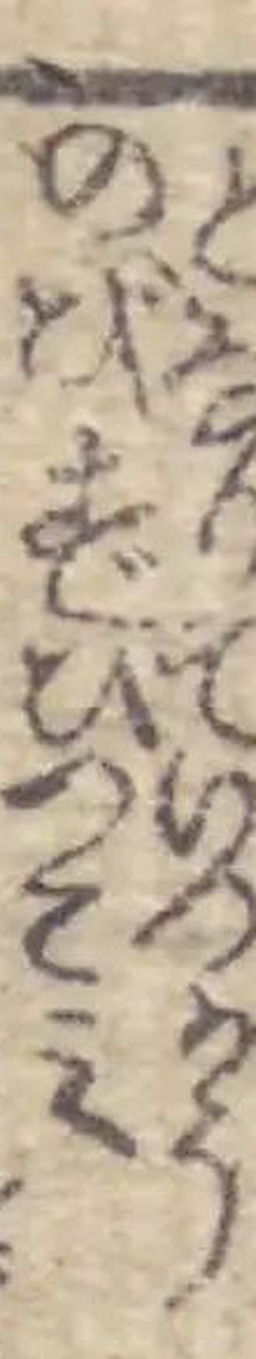のびずひつこみ
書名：化物尽 4巻
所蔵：国立国会図書館 National Diet Library, JAPAN
